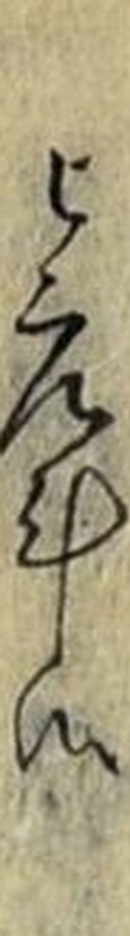被取計候
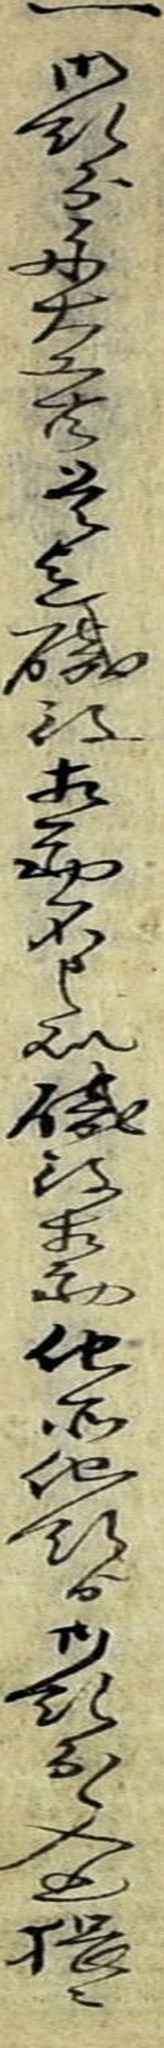一御領分舟大工共是迄職役相勤不申処職役相勤他所他領ゟ御領分へ入込猥ニ
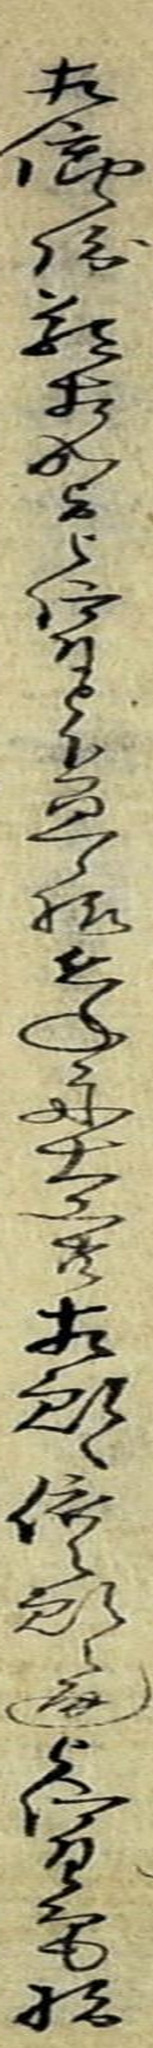相働候儀難相成旨被仰付被下置候様近年舟大工共相願候依之願之通被仰付候而も指
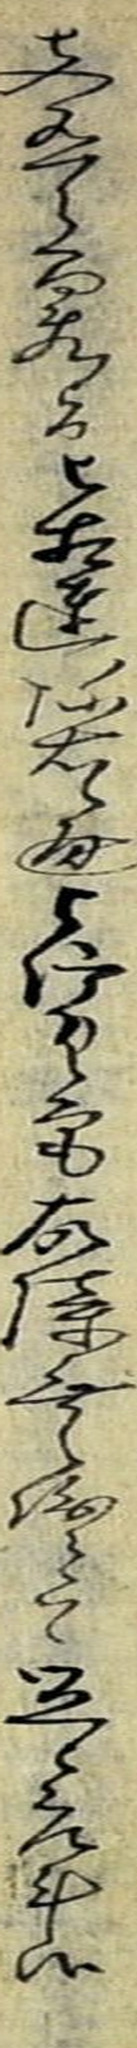支有之間敷旨被相達弥右之通被仰付候而も故障無之儀ニ候ハヽ宜被取計候
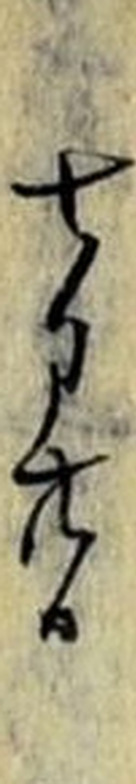七月廿日
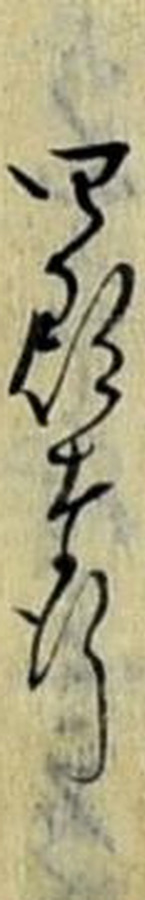四郡奉行
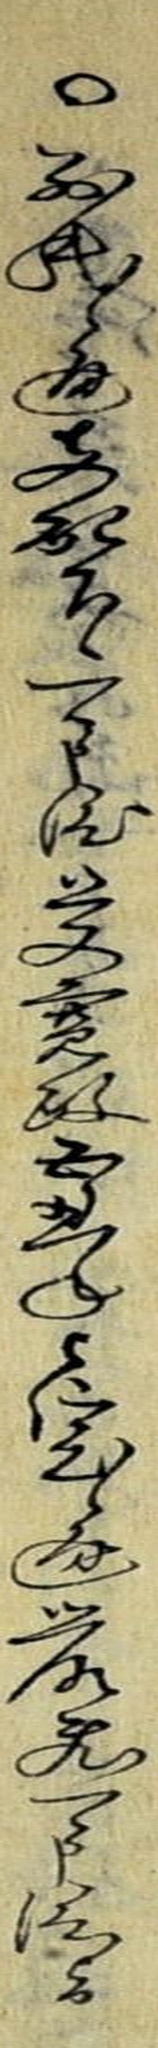〇別紙之通支配下へ可申渡且又寛政五丑年被仰出候通厳敷可申渡旨
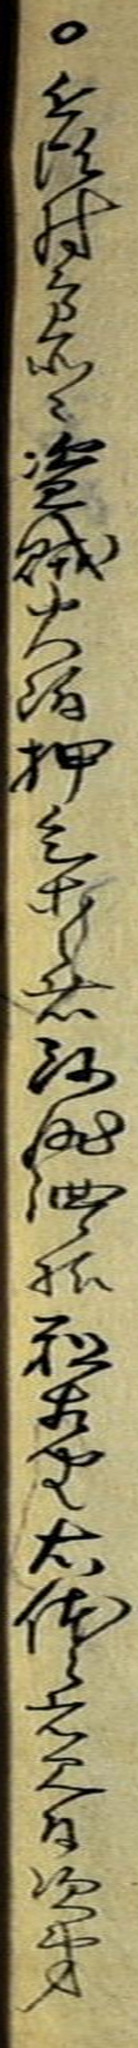〇近頃村方所々盗賊火付押乞等之者致徘徊候様粗相聞候右体之者見付次第
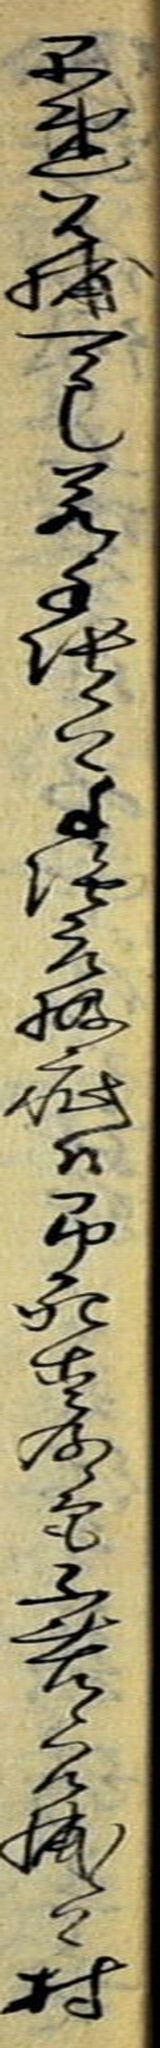早速召捕可申候若手張候ハヽ手強取扱疵付即死等ニ及候而も不苦候召捕候ハヽ村
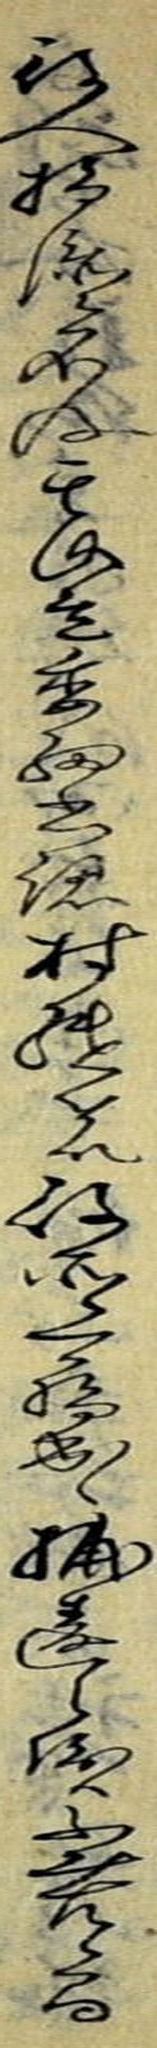役人指添ニ不及其趣意委細書認村継を以役所へ可指出候捕違之儀ハ不苦候間
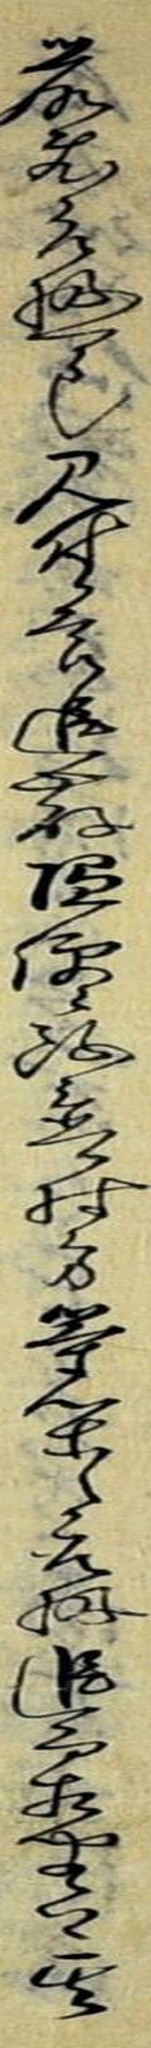厳敷取扱可申候見付候節追散温便ニ致置候村方等閑之取扱追而相聞候ハヽ其
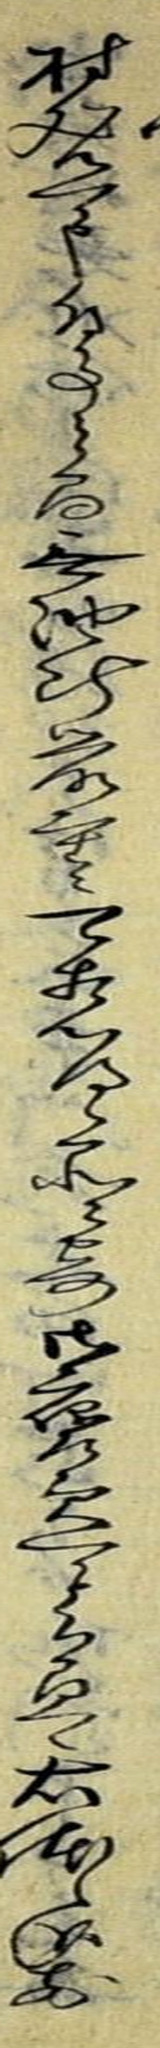村咎可申付事ニ候間無油断厳重ニ可相心得候品ニ寄御褒美可被下置候右体之趣前
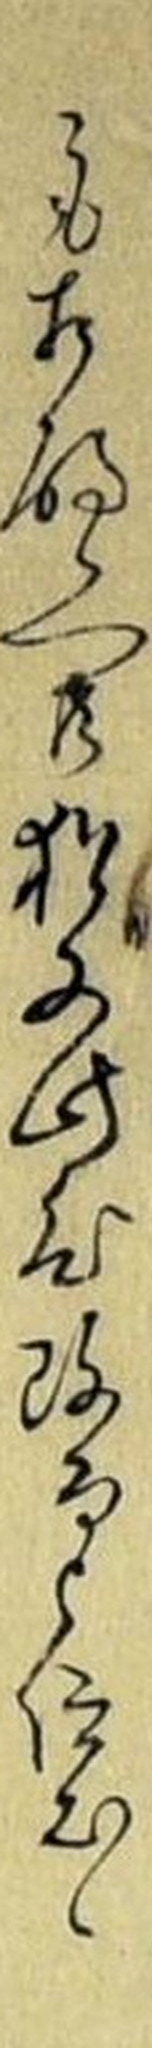ニも相触候へ共猶又此度改而被仰出候
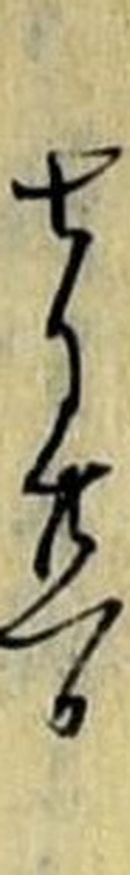七月廿一日
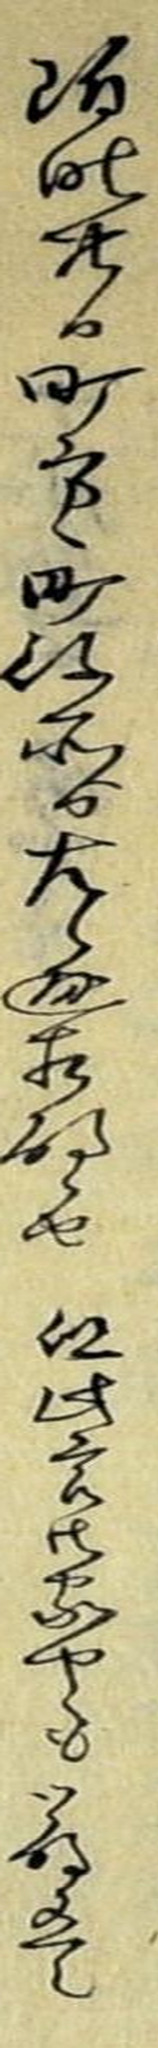附昨廿日町方へ町役所ゟ左之通相触候由但此節御家中へも御触有之
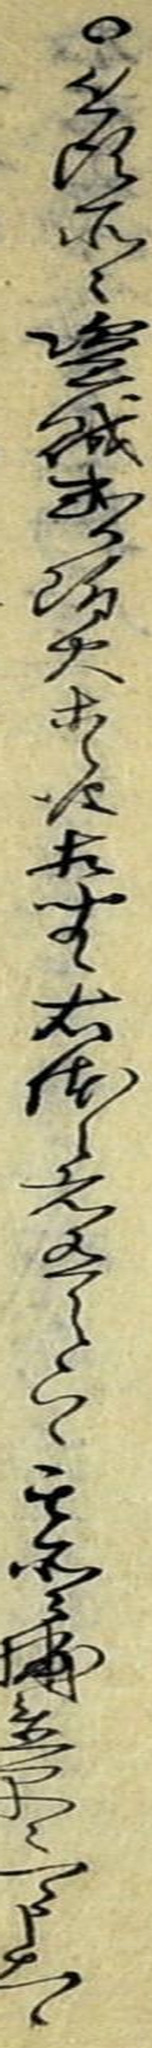〇近頃所々盗賊或ハ付火等之儀相聞候右体之者見付候ハヽ其所ニ捕置早々可申出候
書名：命令之部 三
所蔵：福井県文書館 Fukui Prefectural Archives
